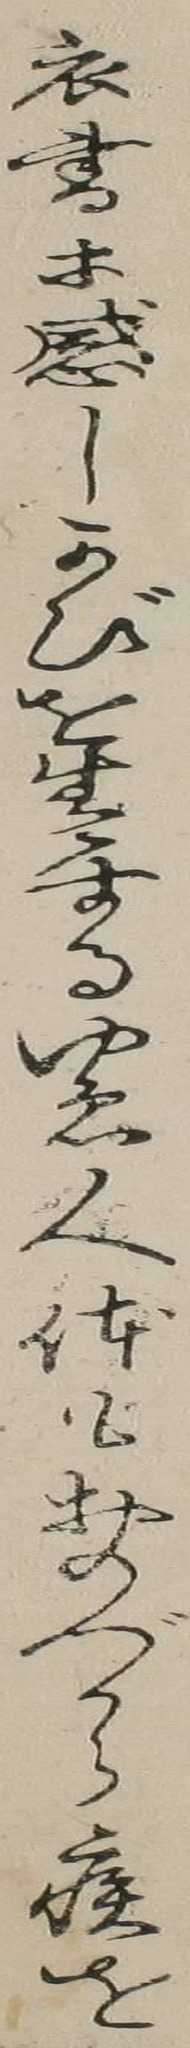衣書等感しかびを生々するゆゑ人体もおのづから疾を
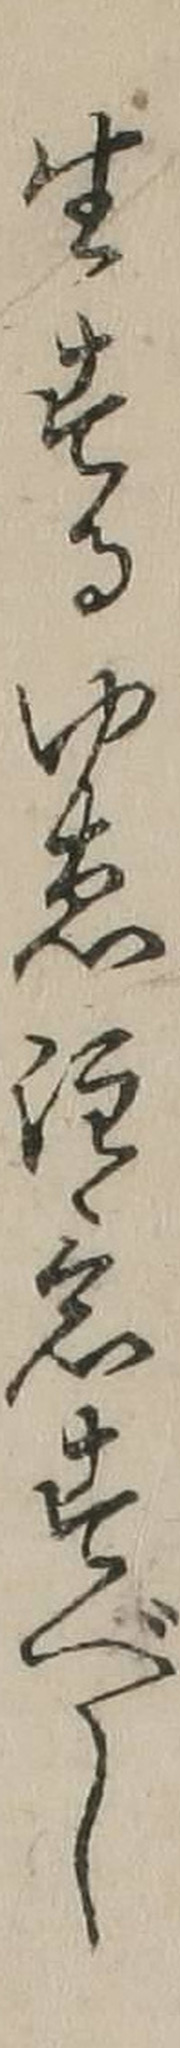生するゆゑ注意すべし
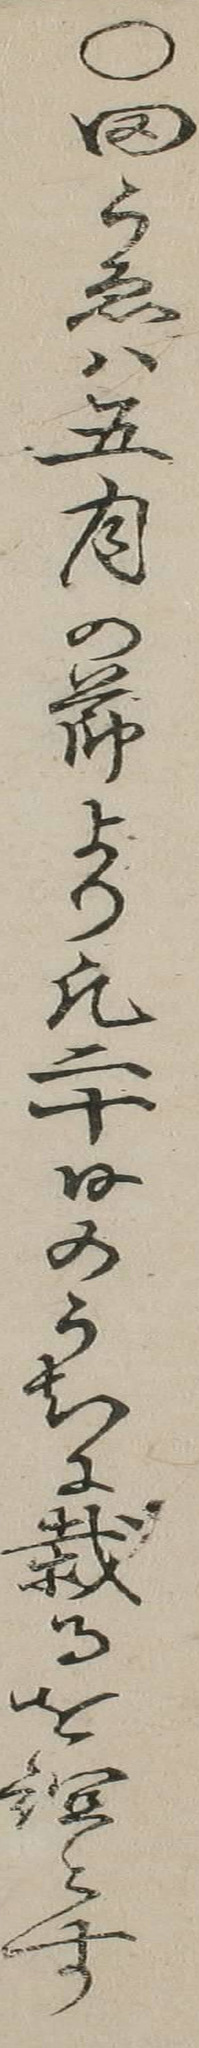○田うゑは五月の節より凡二十日のうちに栽るを誼とす
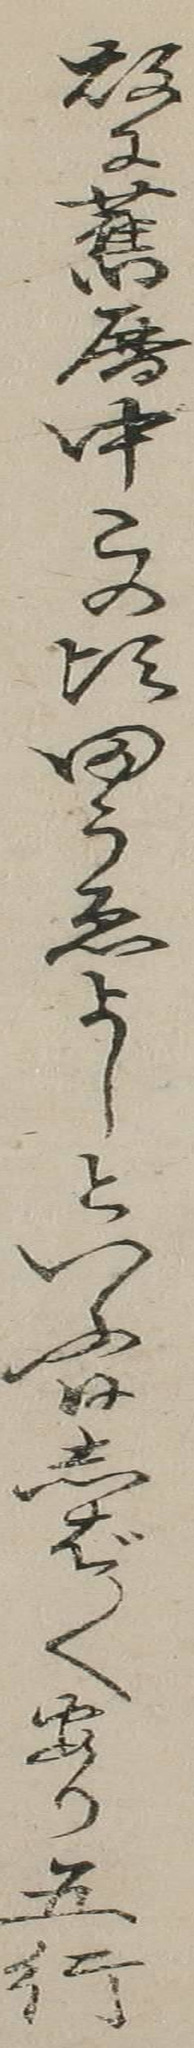故に旧暦中この頃田うゑよしといふ日しば〳〵あり五行
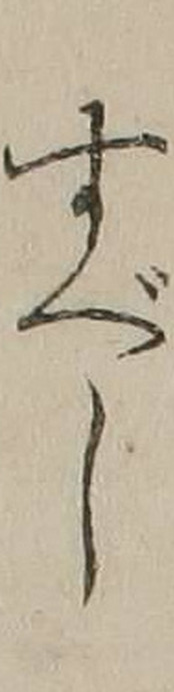すべし
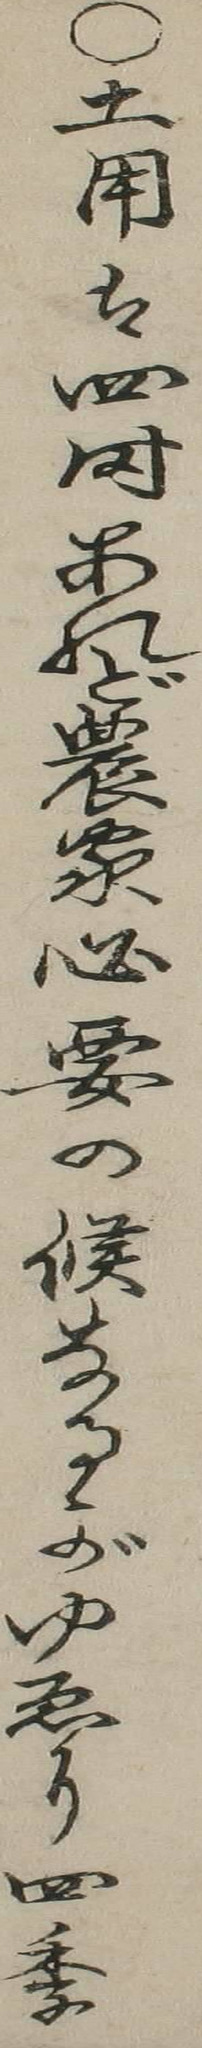○土用は四時あれど農家必要の候なるがゆゑに四季
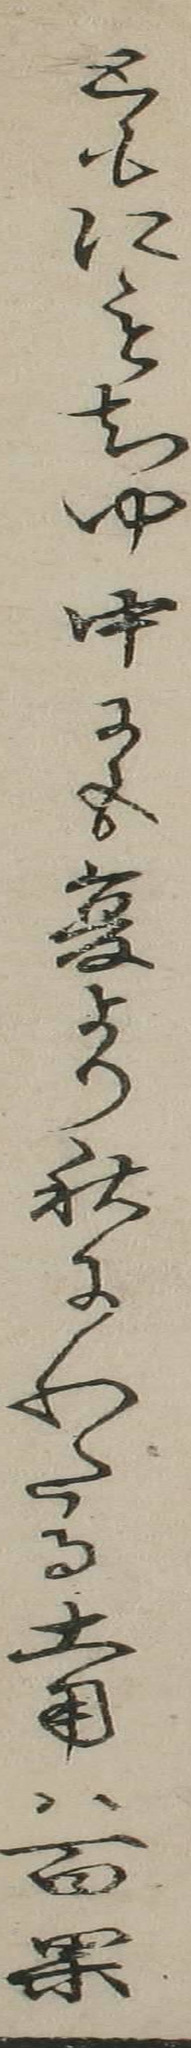ともにもちゆ中にも夏より秋にわたる土用は百果
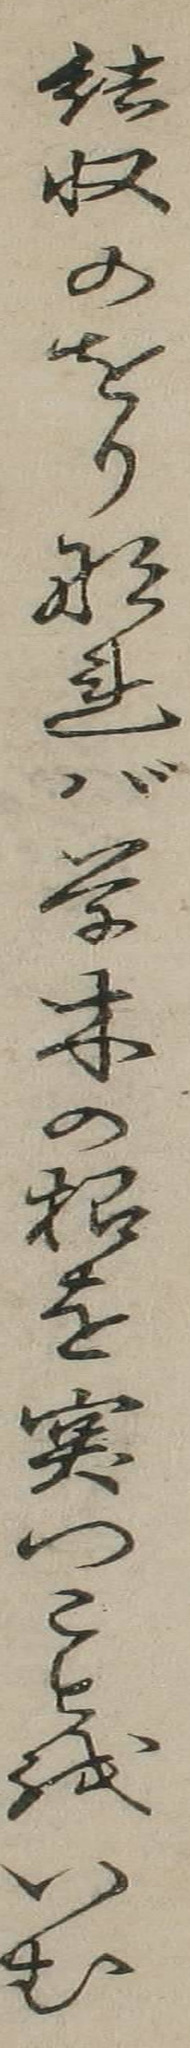結収のをりなれば草木の根を突つことをいむ

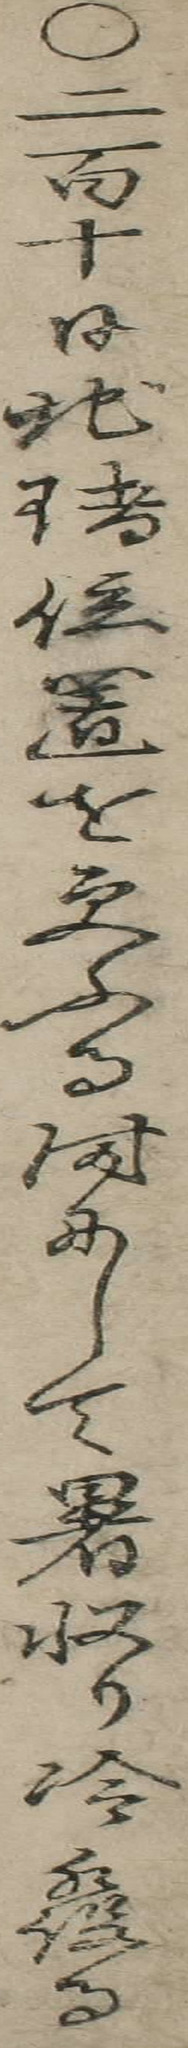○二百十日地位置を更ふる時にして暑収り冷発る
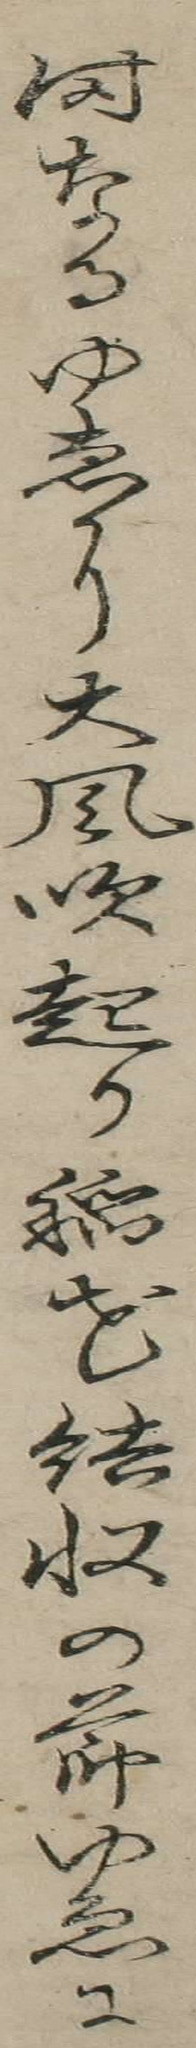時なるゆゑに大風吹起り稲花結収の節ゆゑに
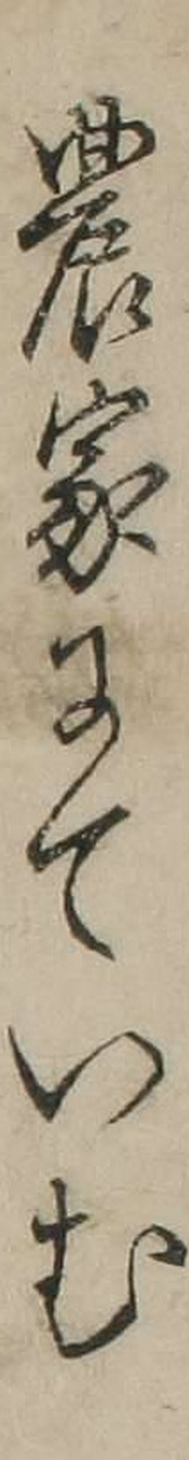農家にていむ
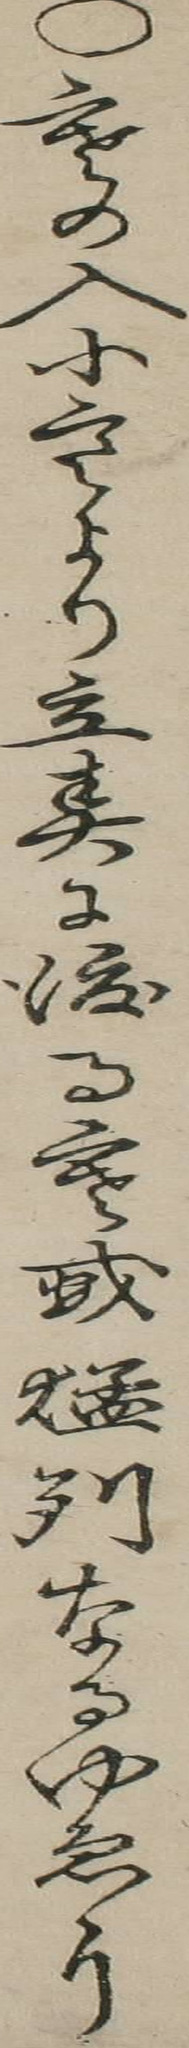○寒の入に寒より立春に渡る寒或猛列なるゆゑに
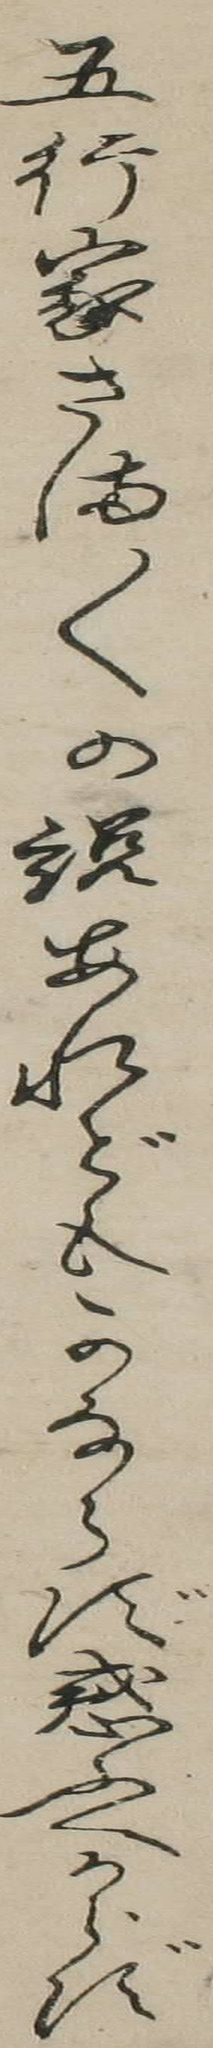五行家さま〳〵の説あれどもかならず惑ふへからず
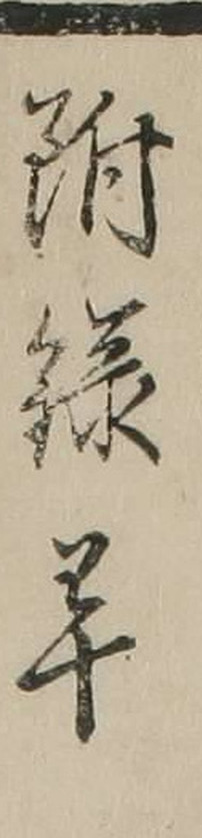付録畢
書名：農蠶必要日読往来
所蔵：東京学芸大学附属図書館 国文学研究資料館
